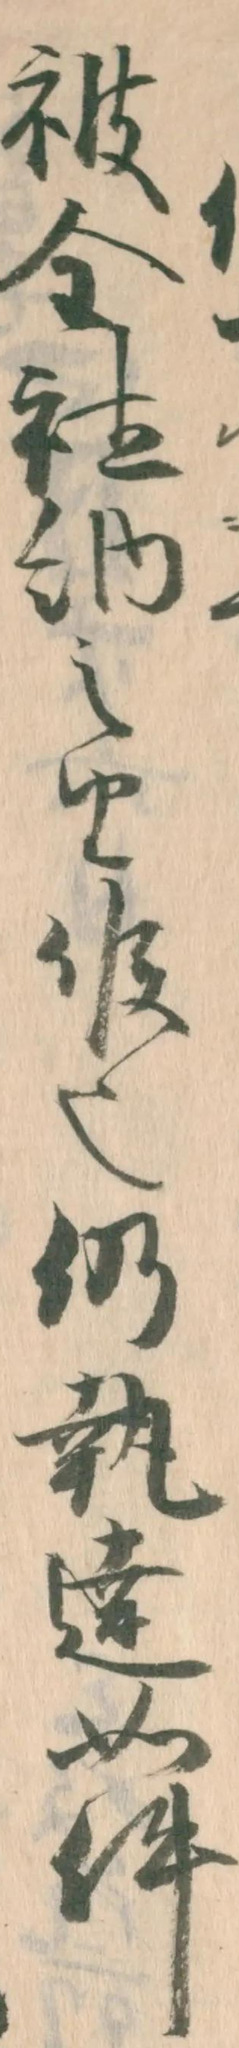被全社納之由候也仍執達如件
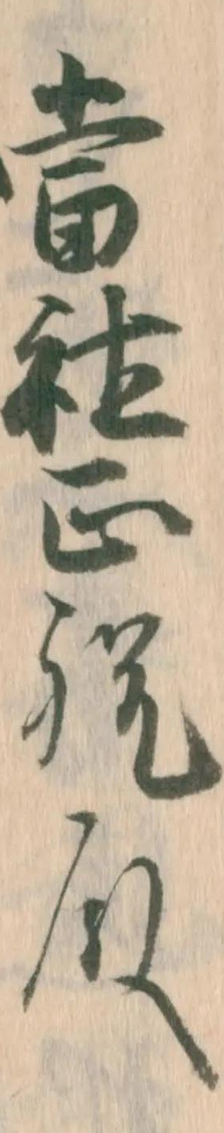当社正祝殿
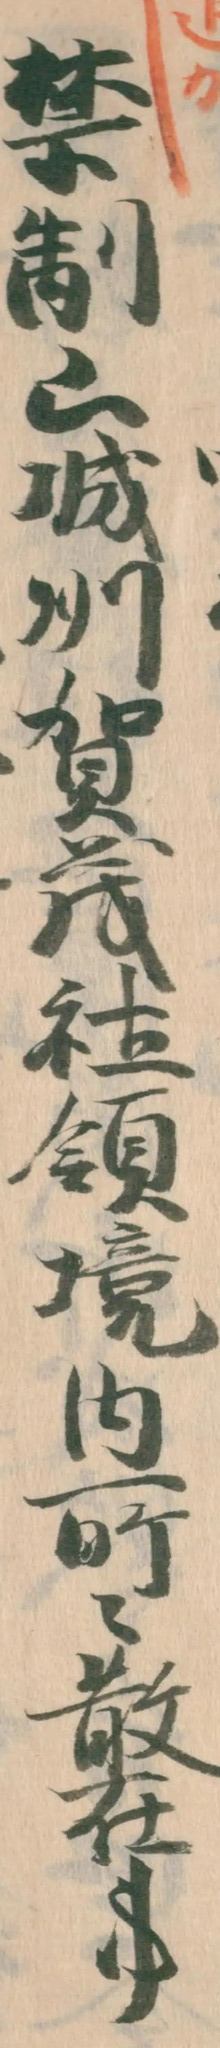禁制山城州賀茂社領境内所々散在事
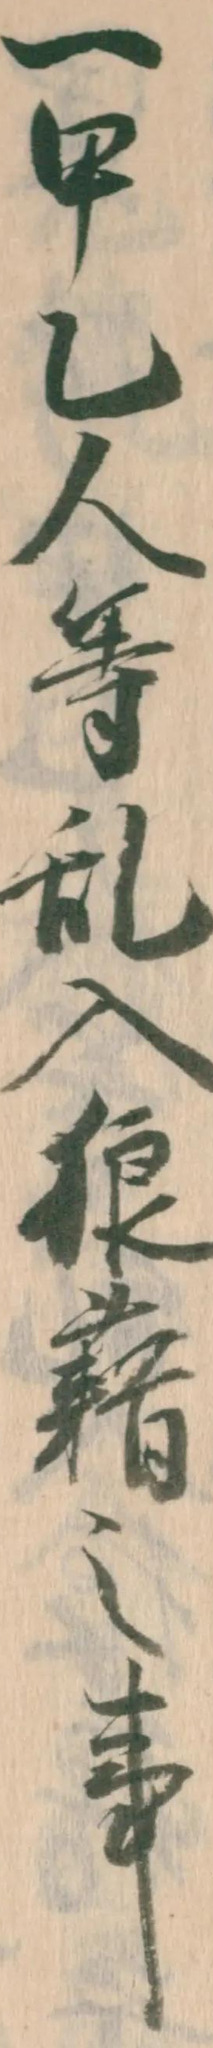一甲乙人等乱入狼藉之事
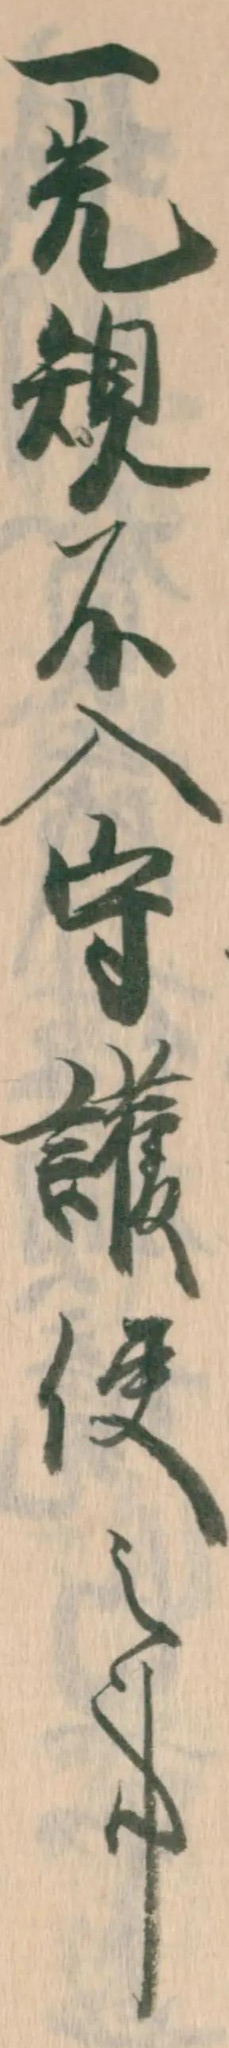一先規不入守護使之事
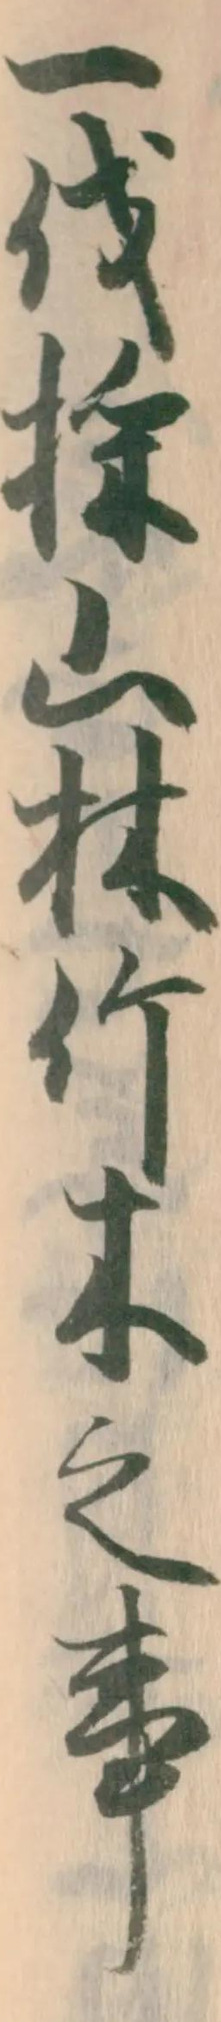一伐採山林竹木之事
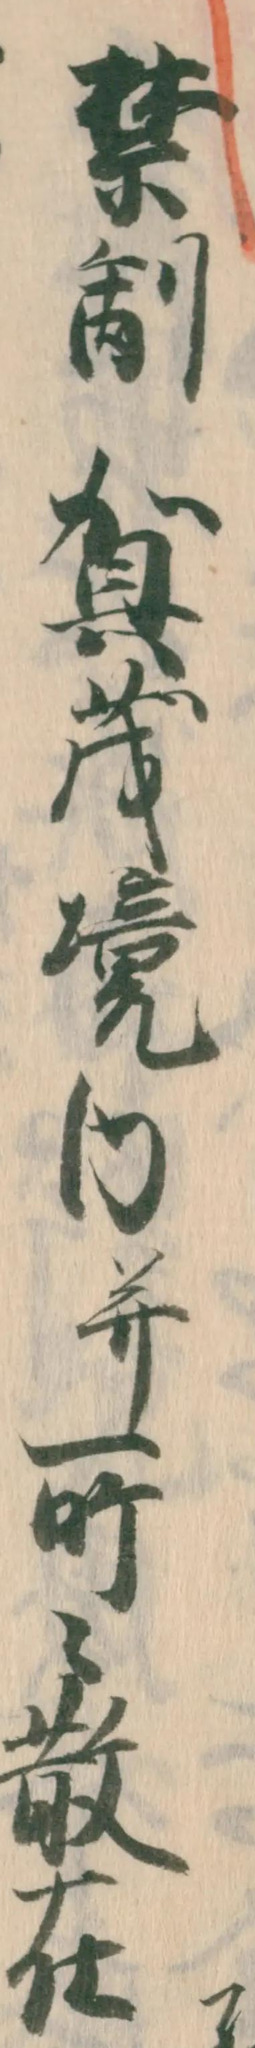禁制賀茂境内并所々散在
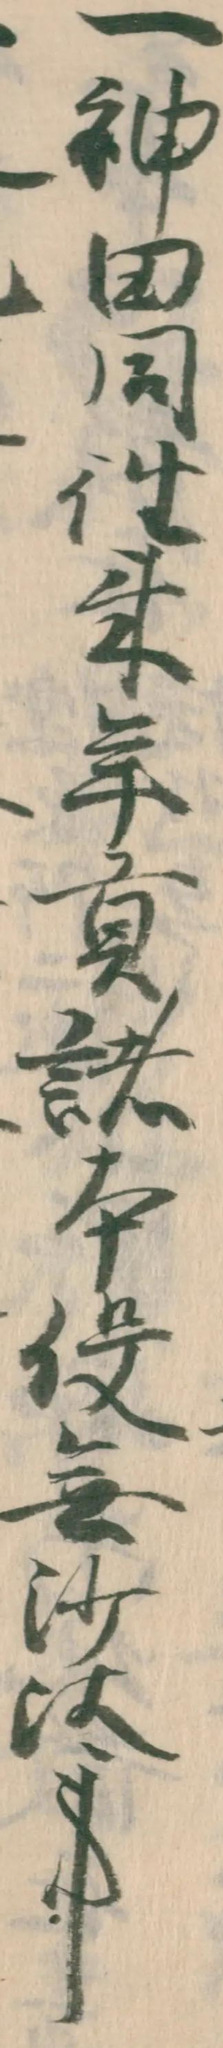一神田同往来年貢諸本役無沙汰事
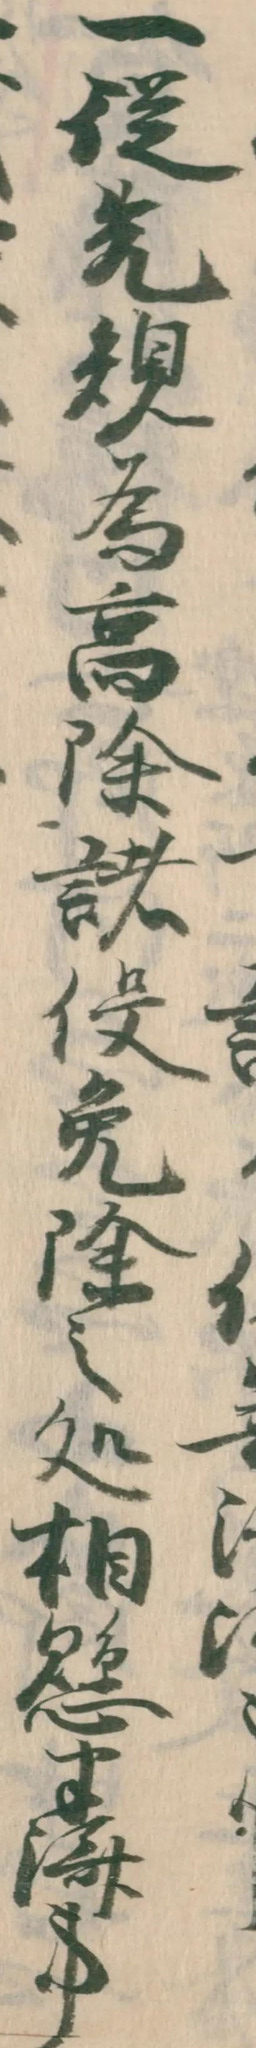一従先規為高除諸役免除之処相懸半済事
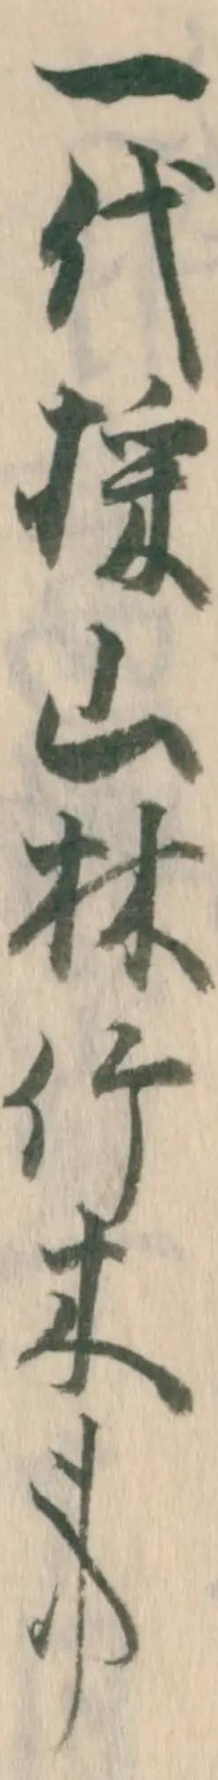一代採山林竹木事
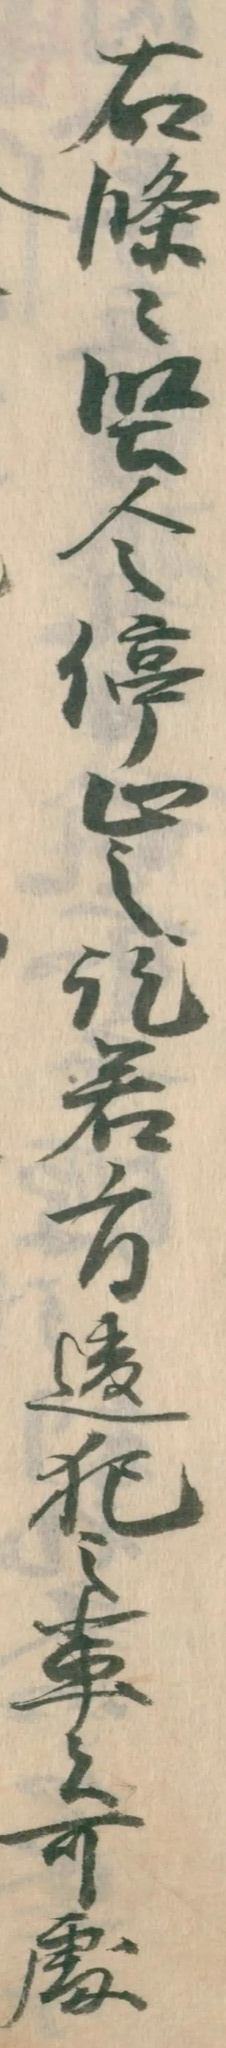右条々堅令停止之訖若有違犯之輩者可処
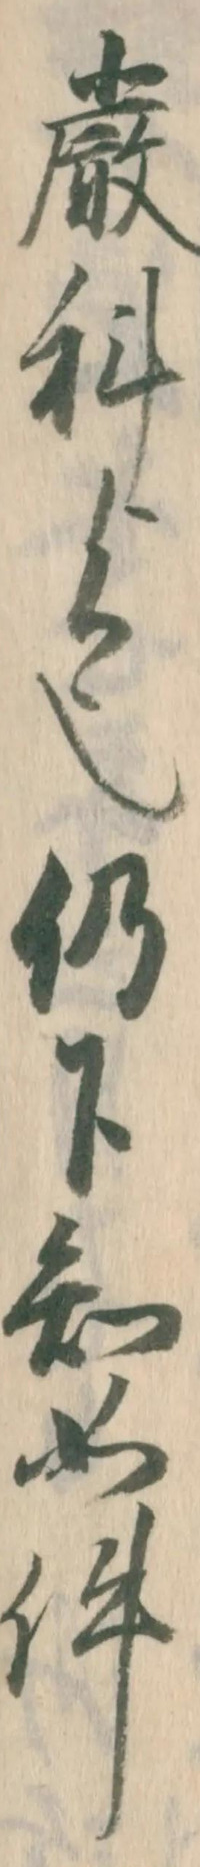厳科者也仍下知如件

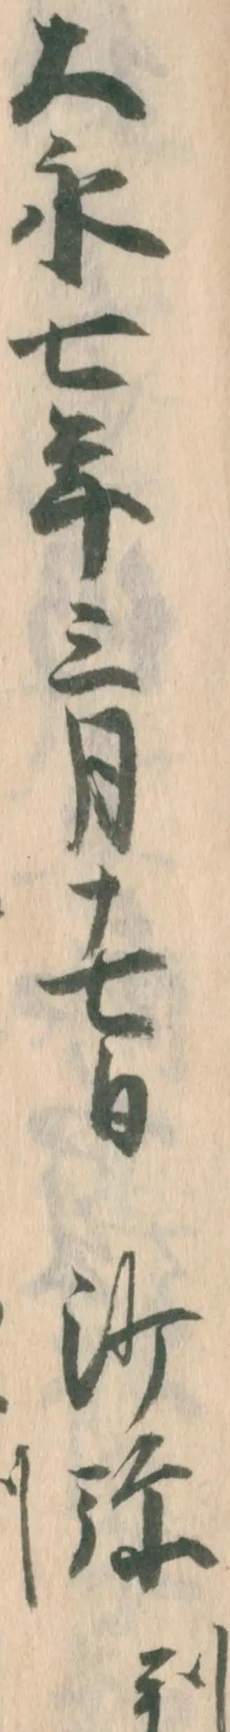大永七年三月十七日沙弥判
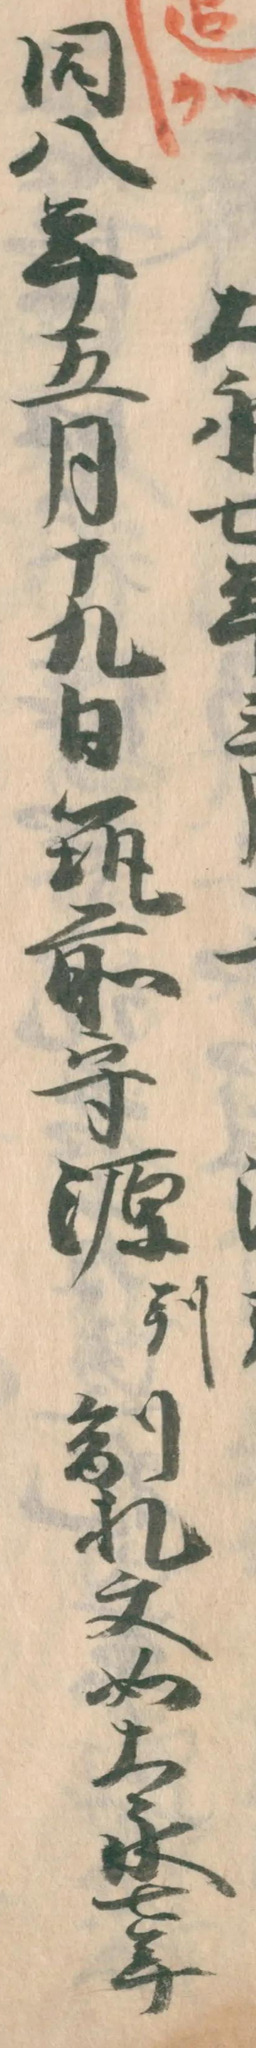同八年五月十九日筑前守源判制札文如大永七年
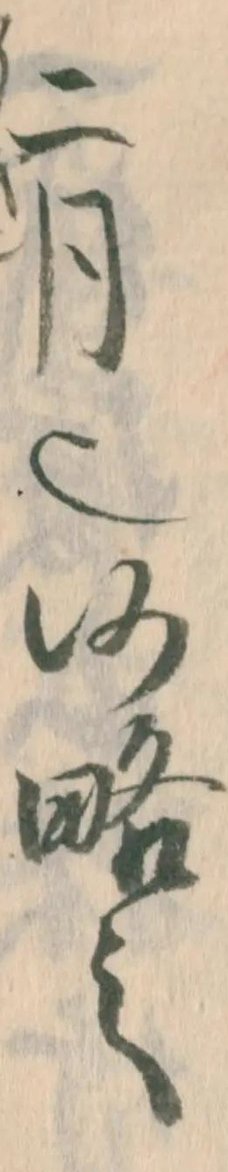二月也仍略之
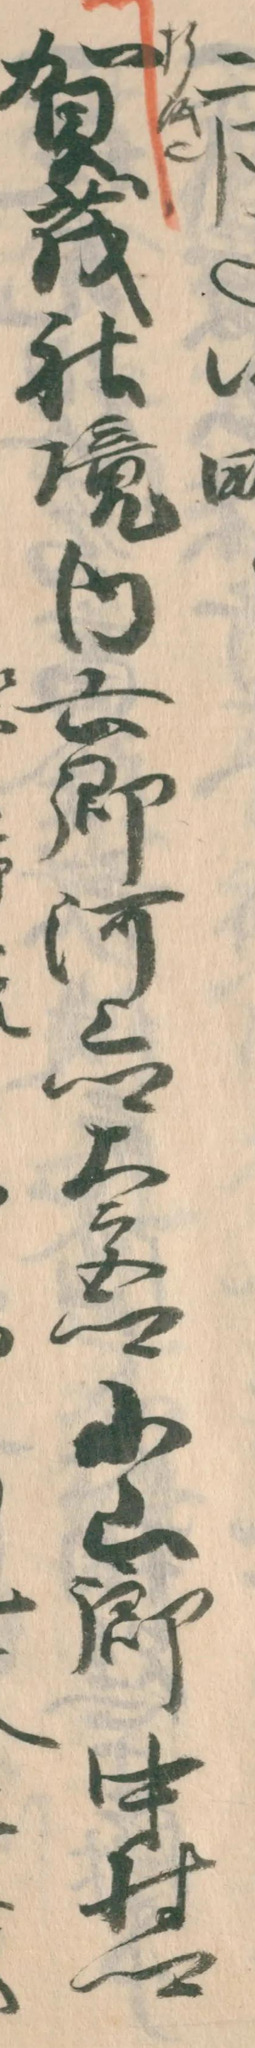賀茂社境内六郷河上郷大宮郷小山郷中村郷
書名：賀茂社記録. 第1冊
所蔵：国立国会図書館 National Diet Library, JAPAN
